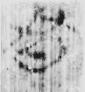冬（冬）
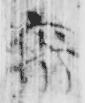○（夕）
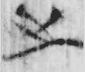之
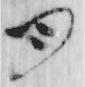月
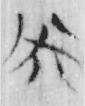癸
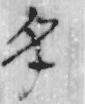丑
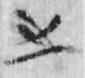之
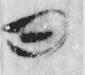日
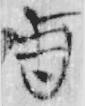周
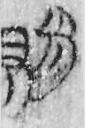賜
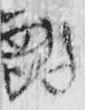訟
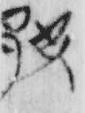○（鄢）
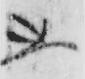之
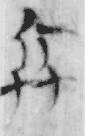兵
